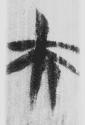夫
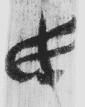民
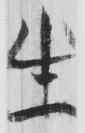生
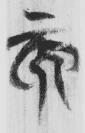而
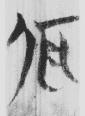佴
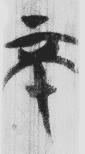不
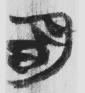明
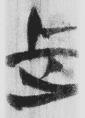上B
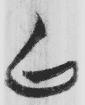㠯（以）
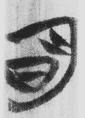明
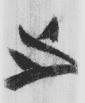之
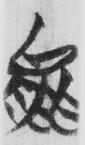能
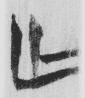亡
